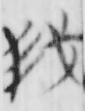○（戟）
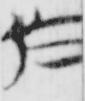於
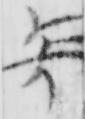長
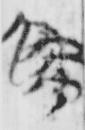○（沙）
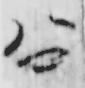公
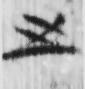之
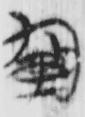軍
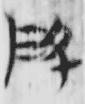阩
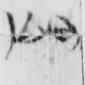門
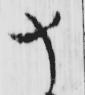又
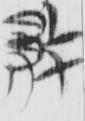敗
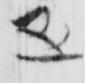疋
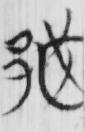○（越）
